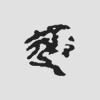復
